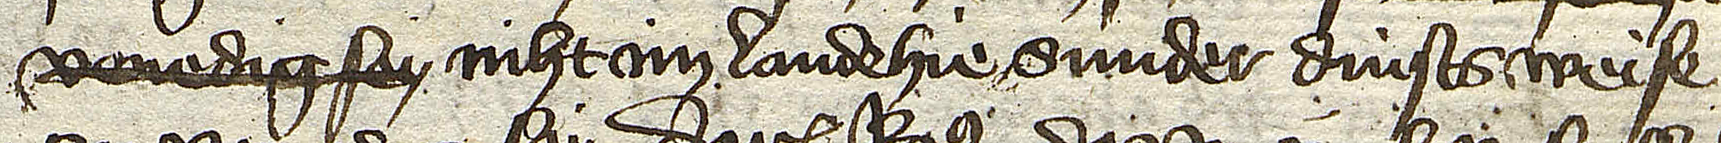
venedig ſey niht im landehie Sunder dinſts weiſe
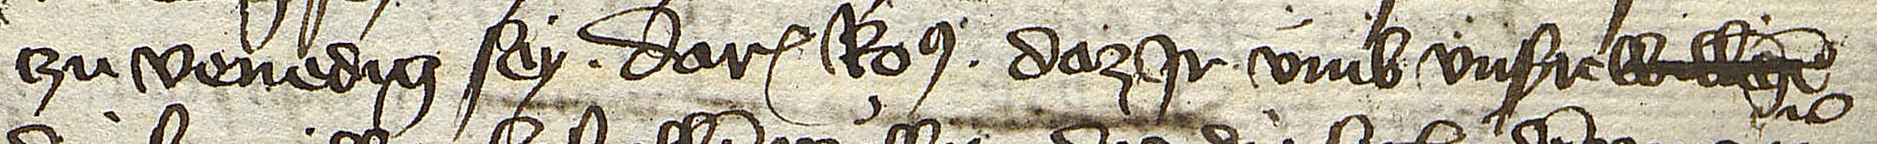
cʒu venedig ſey . Dar* Ro* . daʒ Ir vmb vnſ*r willige*
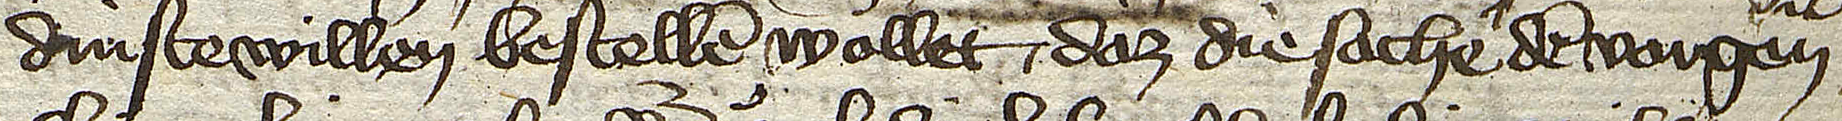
dinſte willen beſtelle* wöllet / daʒ die ſache de* vorgen*
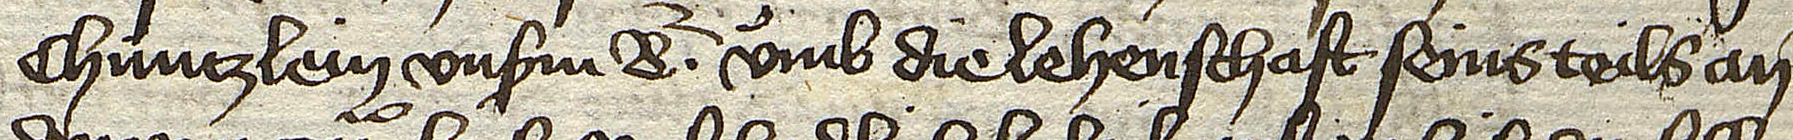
Chüncʒlein vnſ*m B* . v̈mb die lehenſchaft ſeins teils an
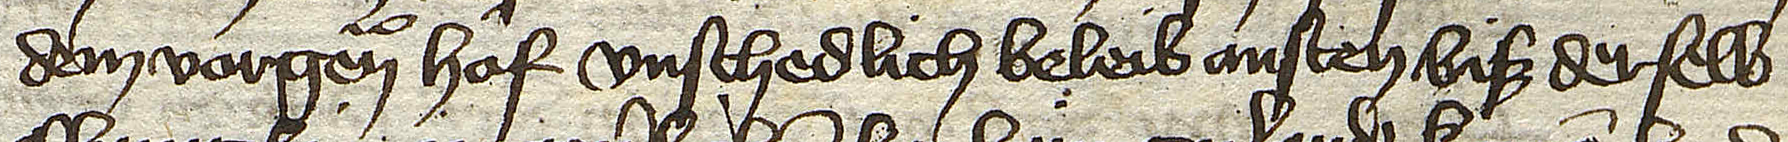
dem vorgen* hof vnſchedlich beleib anſten / biſʒ derſelb
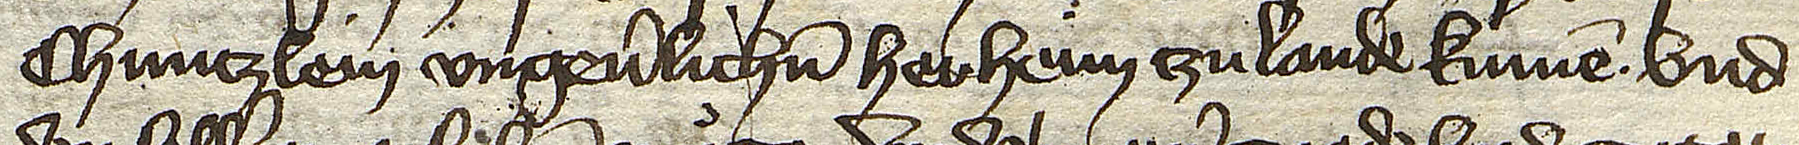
Chuncʒlein vngeu*lichn* herheim cʒu lande kume* . vnd
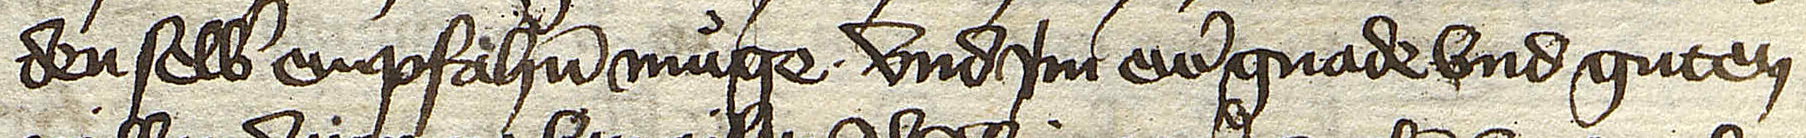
den ſelb* empfahn* müge . Vnd Im ew* gnade vnd guten
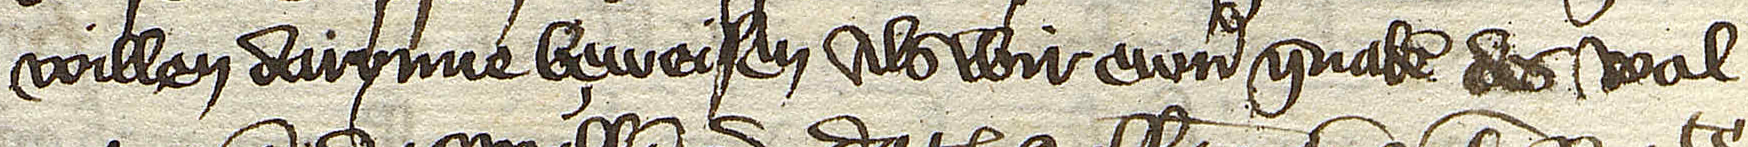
willen darynne beweiſen Als wir ew*n gnade* des wol
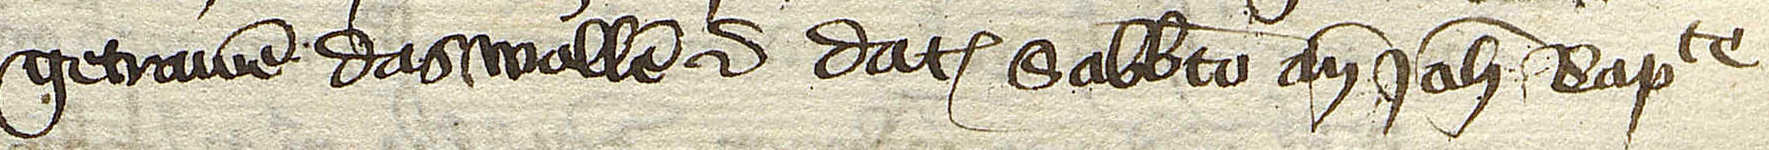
getrawe* Das wölle* ec* Dat* Sabbto* an* Ioh* Bap*
